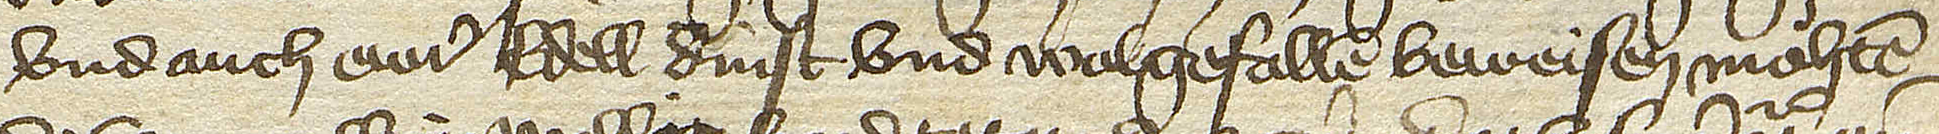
vnd auch ewr* Edell dinſt vnd wolgefalle* beweiſen möhte*
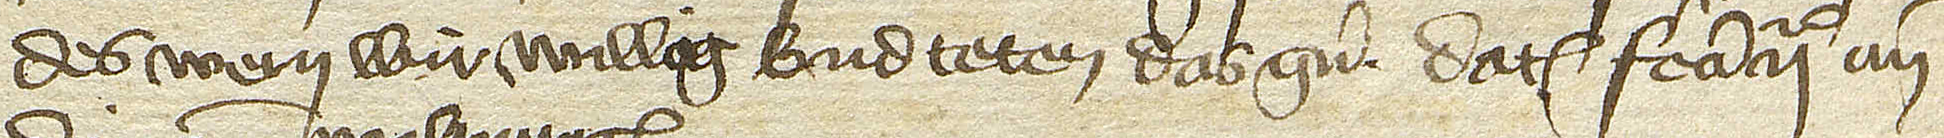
des wern Wir willig vnd teten das g*n . Dat* fea* ii* an*
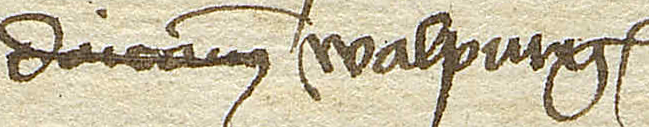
Doicam* walpurg*
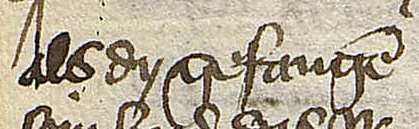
als dy gefange*
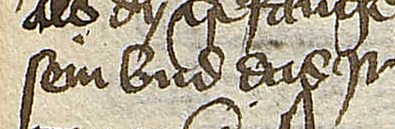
ſein vnd das Ir
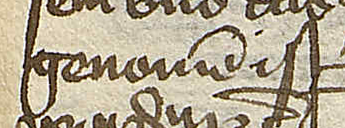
genome* iſt
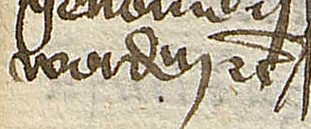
worden ec*
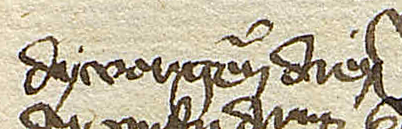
dy vorgen* drey
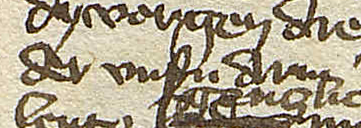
der vnſ*n Arm
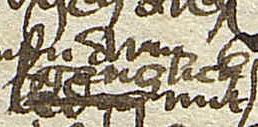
gencʒlich
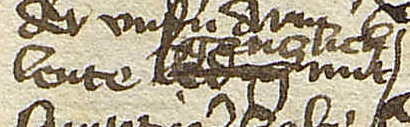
leute ledig mit
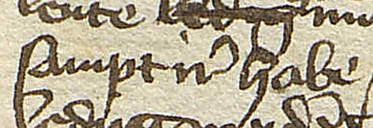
ſampt ir* habe
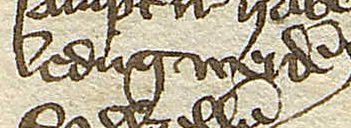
ledig werde*
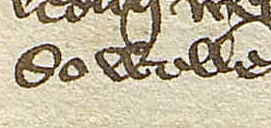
So wolle*
